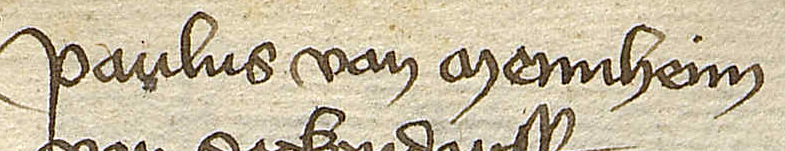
Paulus von Mennheim
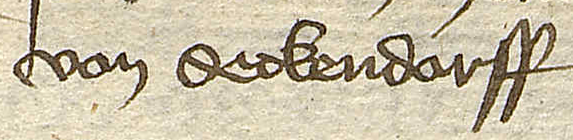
von Seckendorff
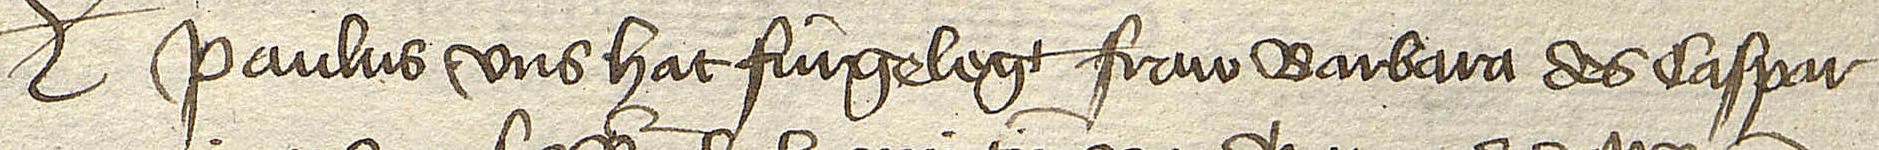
L* Paulus vns hat fürgelegt fraw Barbara des Caſpar
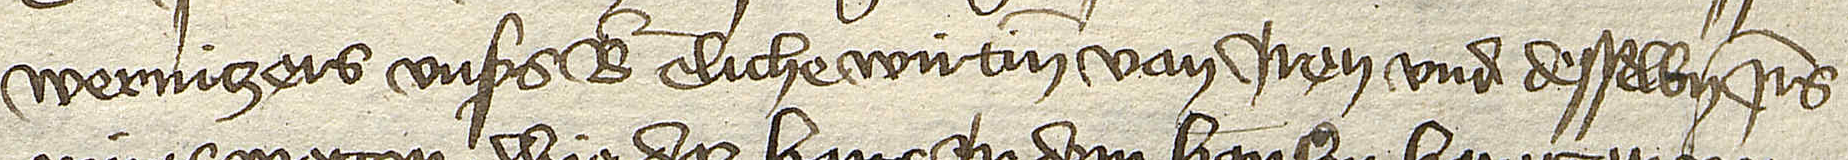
wernicʒers vnſ*s B* eliche wirtin* von Iren vnd deſſelbn* Irs*
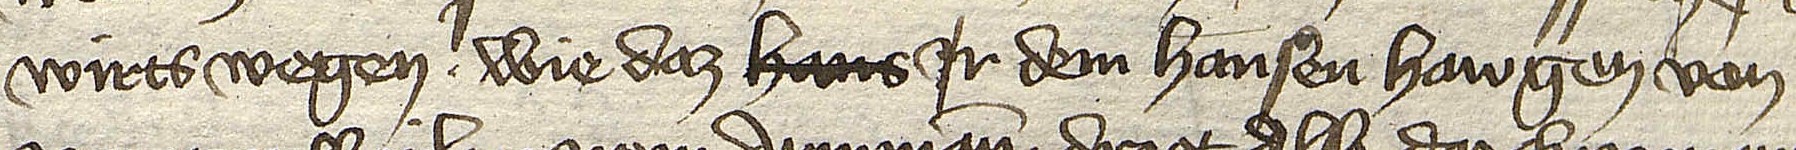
wirts wegen . wie daʒ hans Ir dem hanſen hawgen von
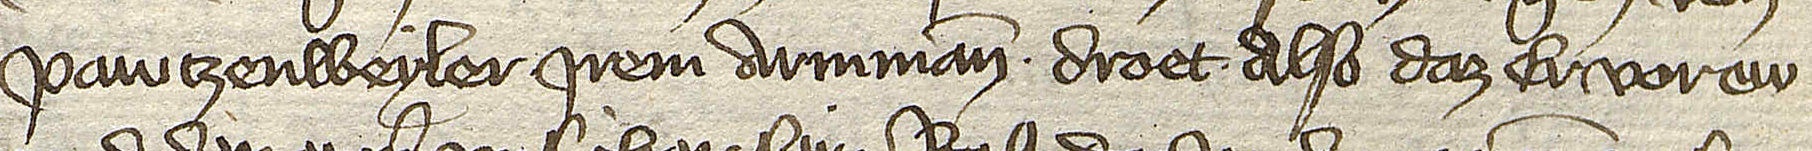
Pawcʒenweyler Irem Armman* . droet . Alſo daʒ Er vor ew
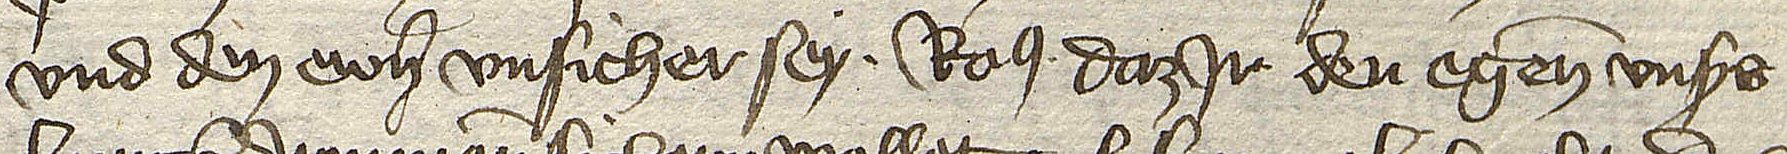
vnd den ewn* vnſicher ſey . Ro* . daʒ Ir den egen* vnſ*s
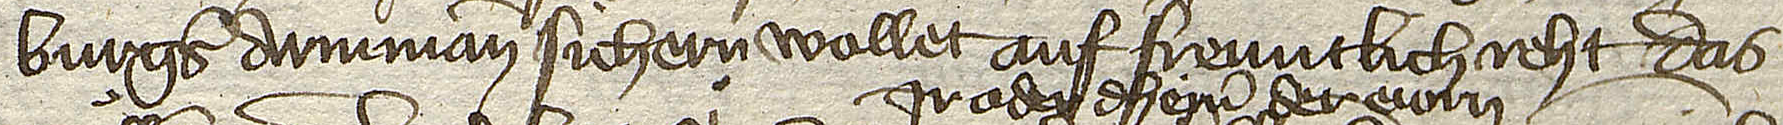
burgs* Armman* ſichern wollet auf freuntlich reht / das
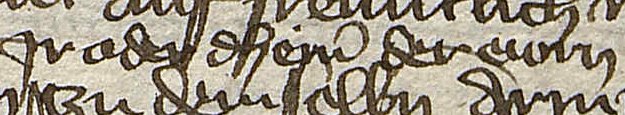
Ir oder dhein* der ewrn
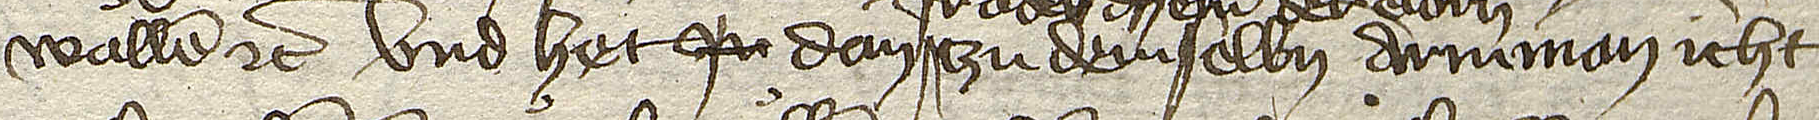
wölle* ec* vnd het In dan cʒu demſelbn* Armman* icht
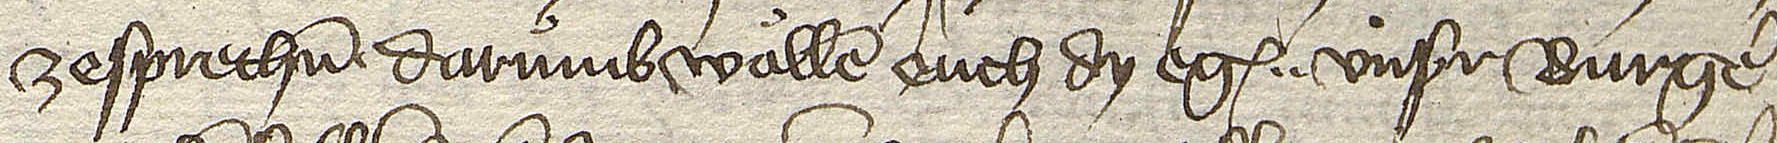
cʒeſprechn* / darümb wölle* euch dy eg* ~ vnſ*r Burge*
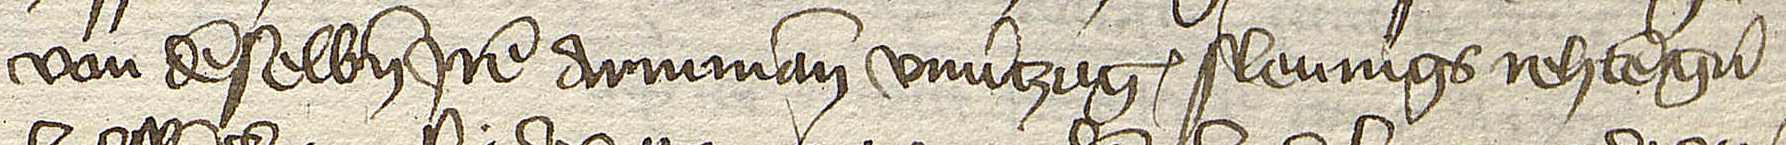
von de*ſelbn* Ire* Armman* vnu*cʒog* ſleunigs rechte* gn*
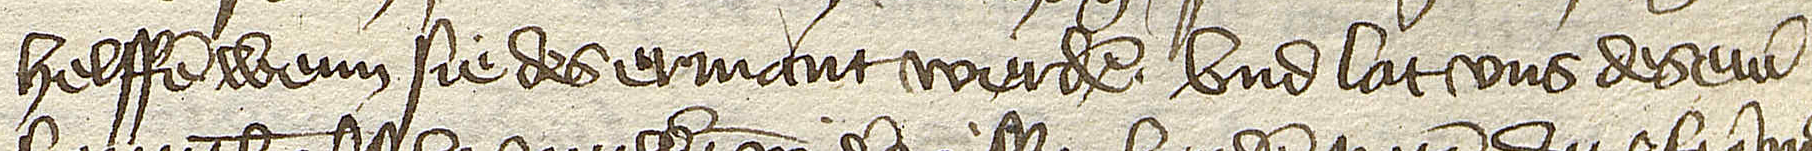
helffe* wenn ſie des ermant werde* . vnd lat vns des ew*
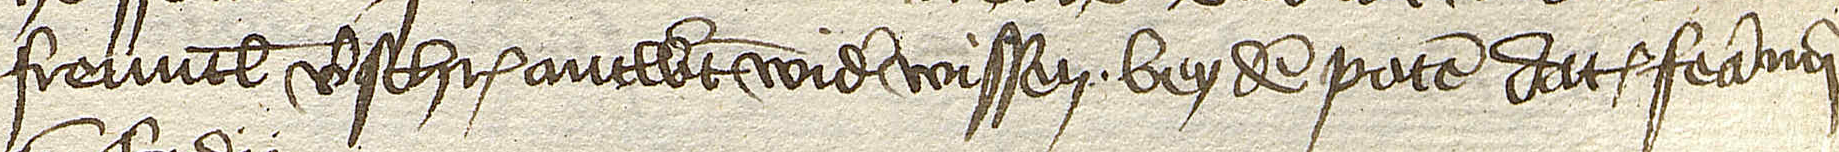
freuntl* v*ſchr* antw*t wid* wiſſen . bey de* pote* dat* fea* iiii*
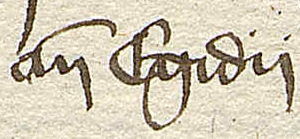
an* Egidii
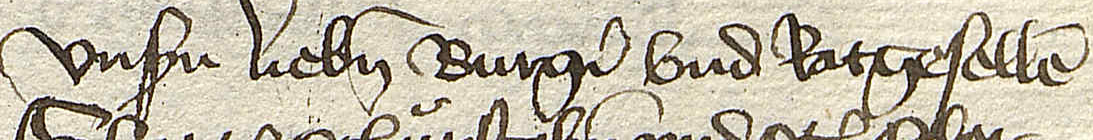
Vnſ*n liebn* Burge* vnd Ratgeſelle*
